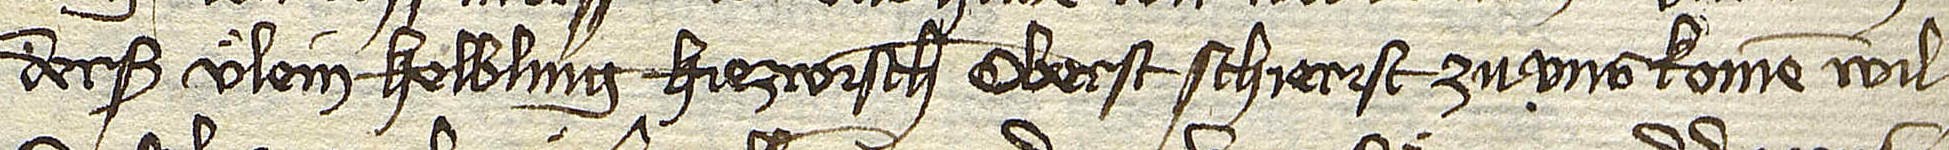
derſ* v̈lein helbling hieʒwiſch* Oberſt ſchieriſt ʒu vns kome* wil
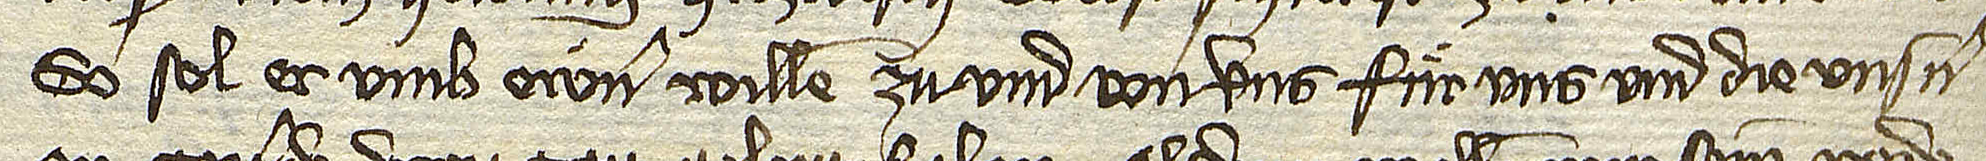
So ſol er vmb ewn* wille* ʒu vnd von vns für vns vnd die vnſn*
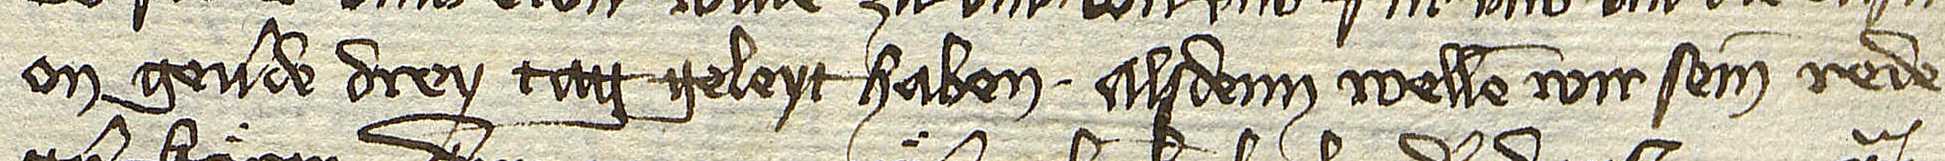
on geu*de drey tag geleyt haben . Alsdenn welle* wir ſein rede
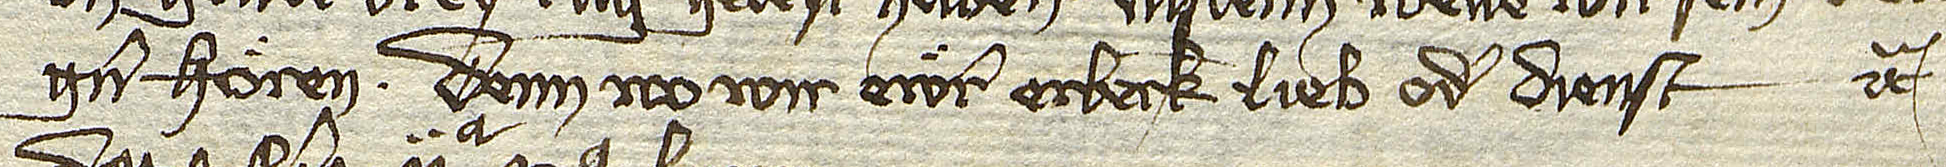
gn* hören . Denn wo wir ewr* erberk* lieb od* dienſt ec*
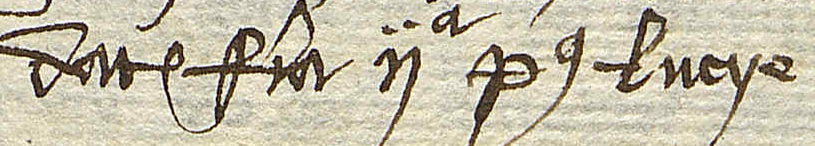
Dat* f*ia ii* p* Lucye
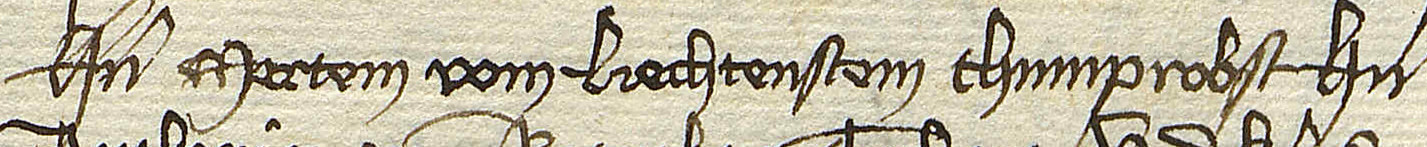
Hn* Mertein vom Liechtenſtein thumprobſt hn*
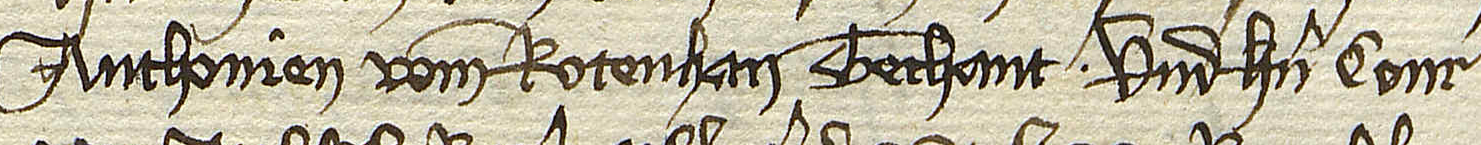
Anthonien vom* Rotenhan Techant . Vnd hn* Conr*
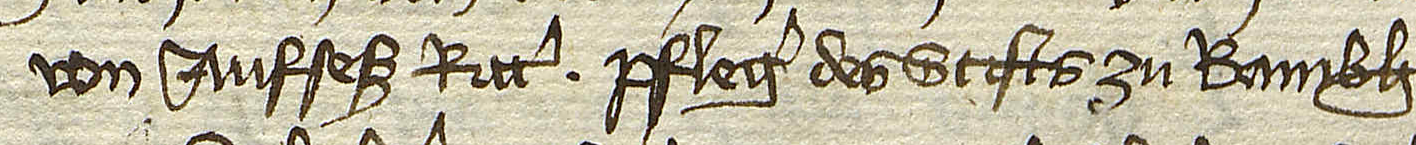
von Aufſeſʒ Ritt* . pfleg* des Stifts ʒu Bamb*g
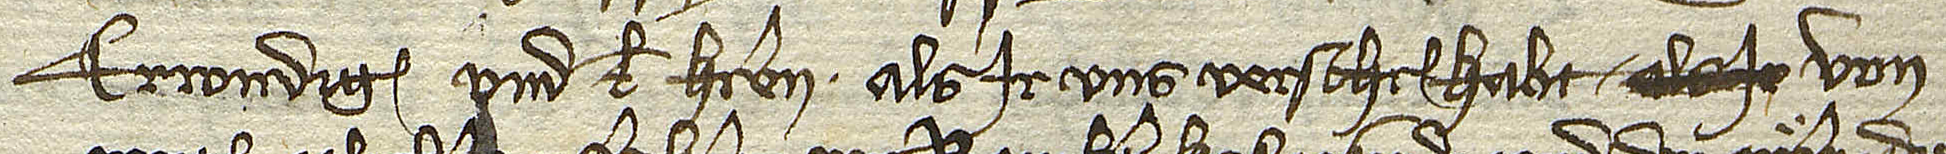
Erwirdig* vnd l* hren* . als Ir vns verſchr* habt / als Ir von
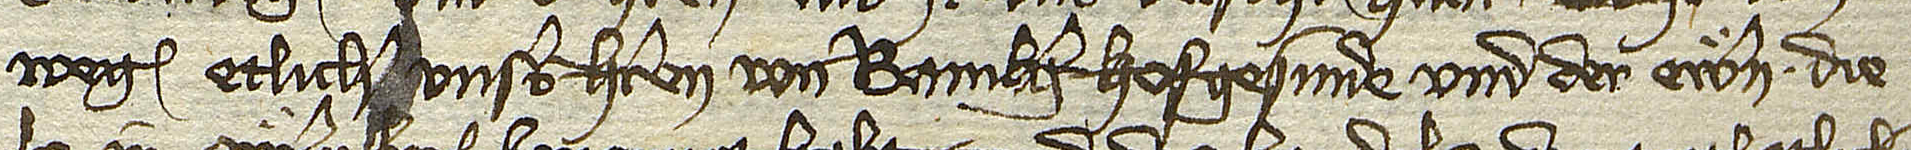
weg* etlich* vnſ*s h*ren von Bamb*g hofgeſinde vnd der ewn* die
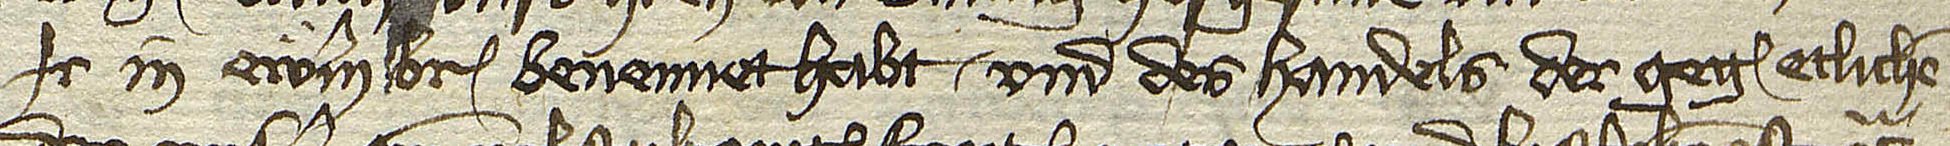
Ir in ewm* br* benennet habt / vnd des handels der geg* etliche*
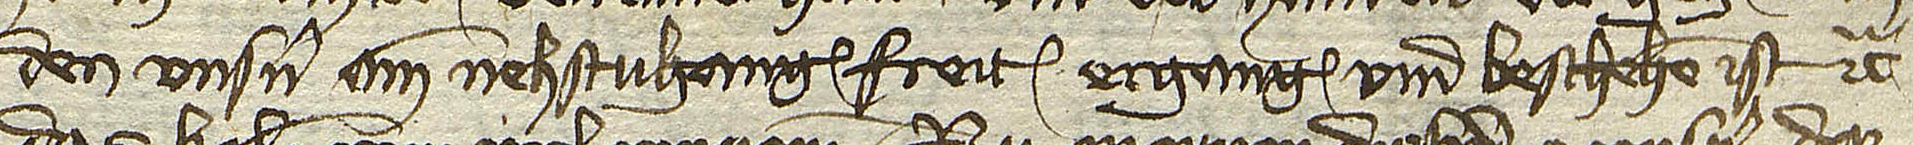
den vnſn* am* nehſtu*gang* freit* ergang* vnd beſchehe* iſt ec*
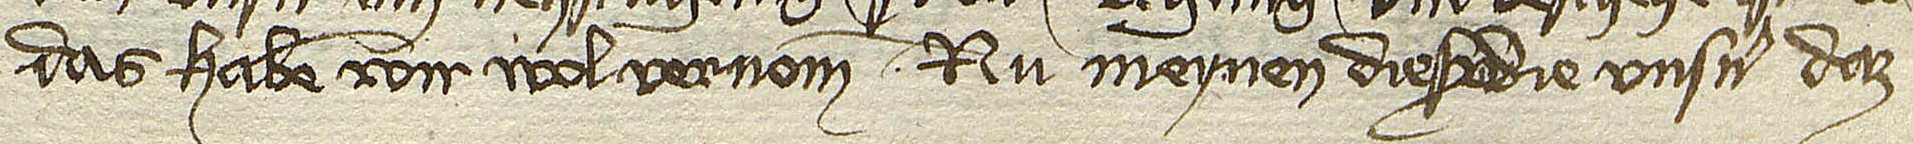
das habe* wir wol vernom* . Nu meynen dieſ* die vnſ*n daʒ
